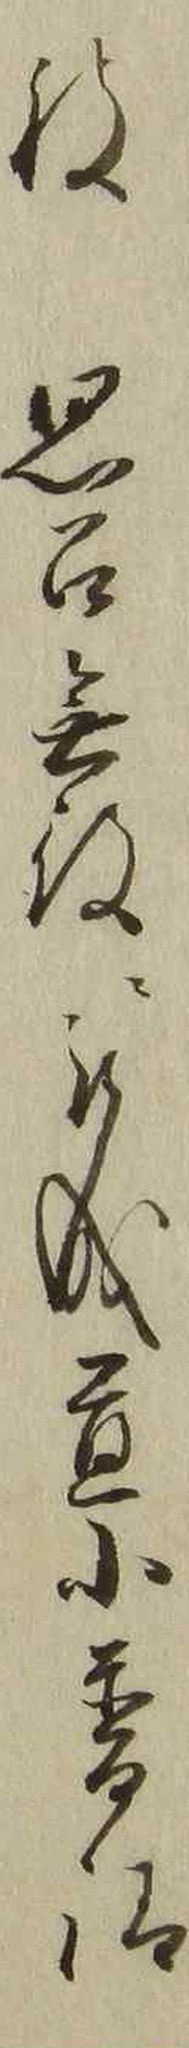被思召無役ニ被成置小普請
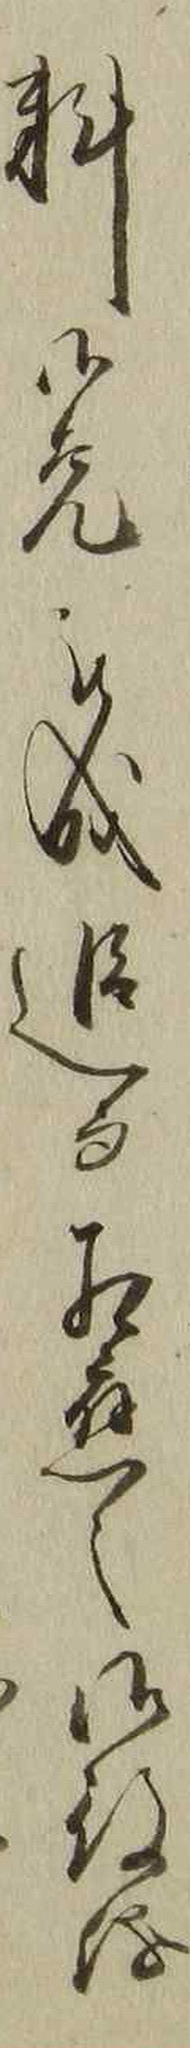料御充被成追而相応之御役儀
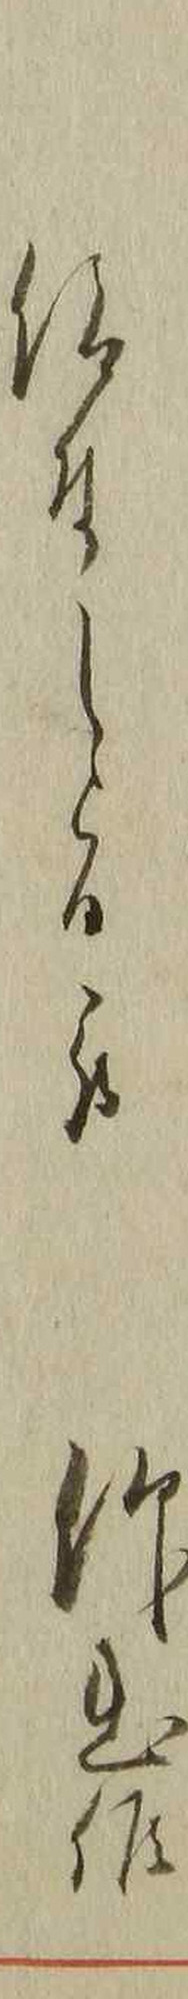可被仰付候旨被仰出候
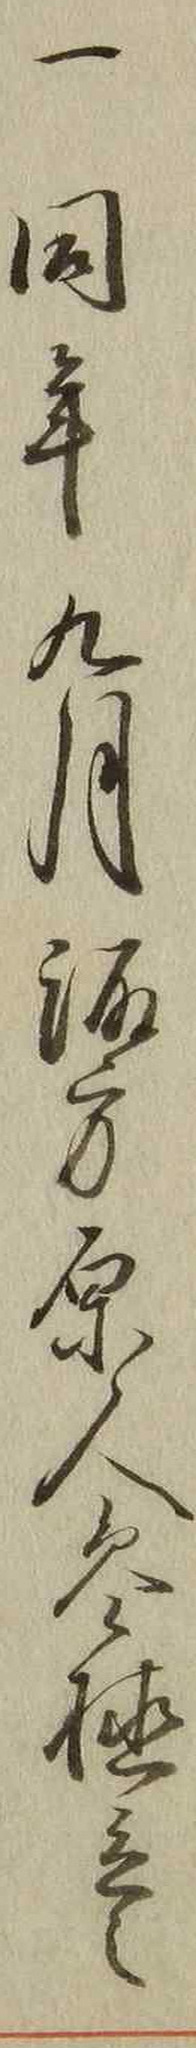一同年九月諏方原人参植立之
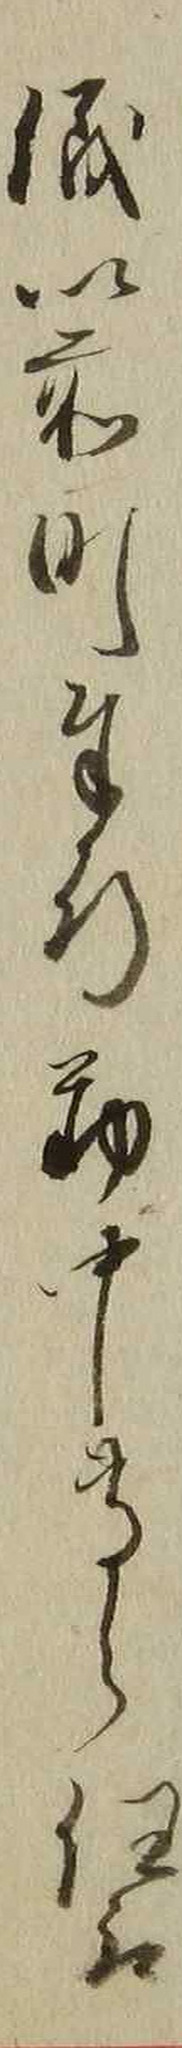儀以前町奉行勤中専ら任取
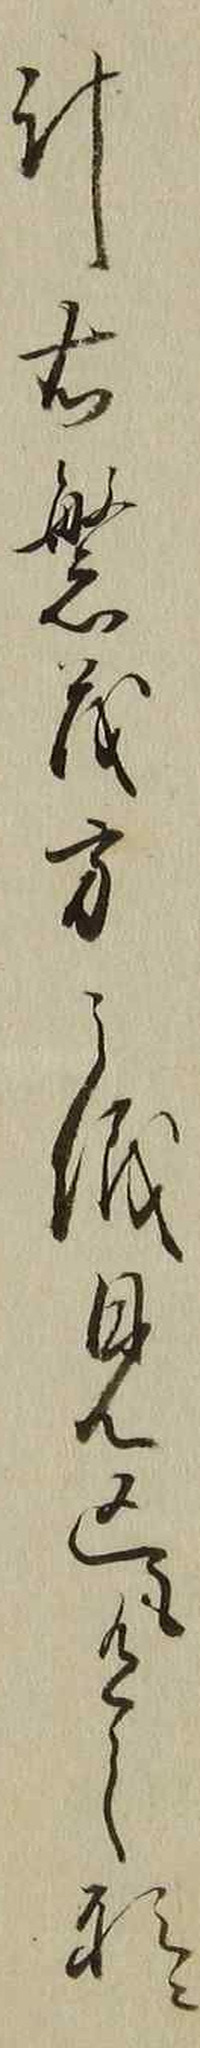計右磐茂方之儀見込も有之願ニ
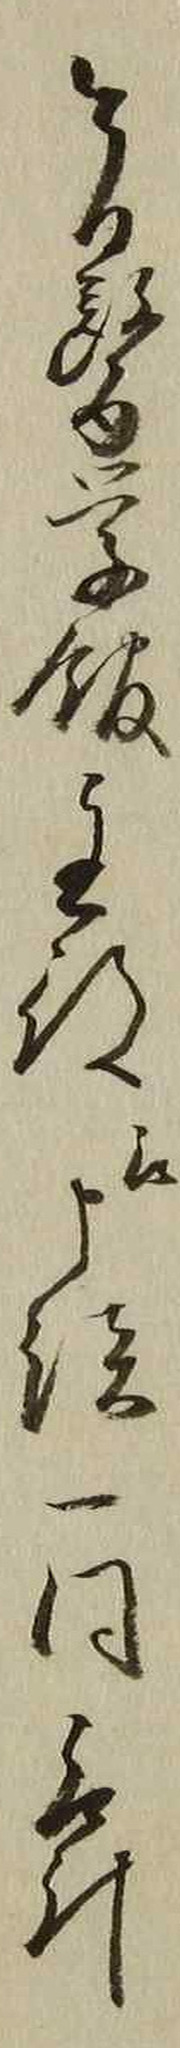医学館主役江申談一同取計
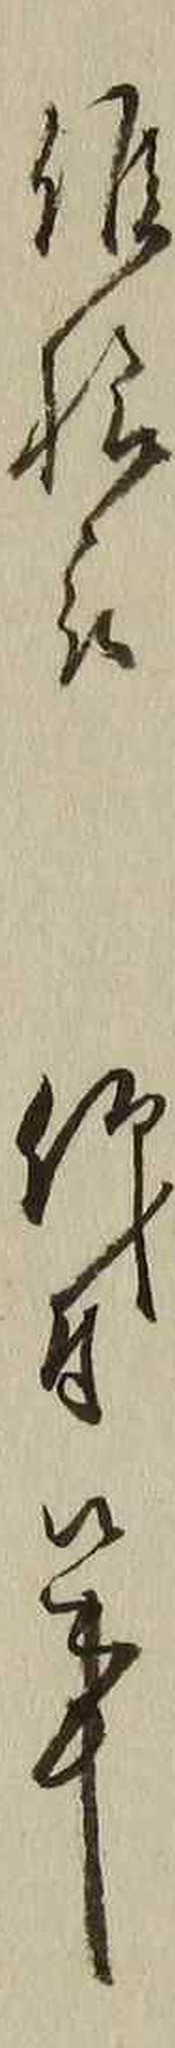候様被仰付候事
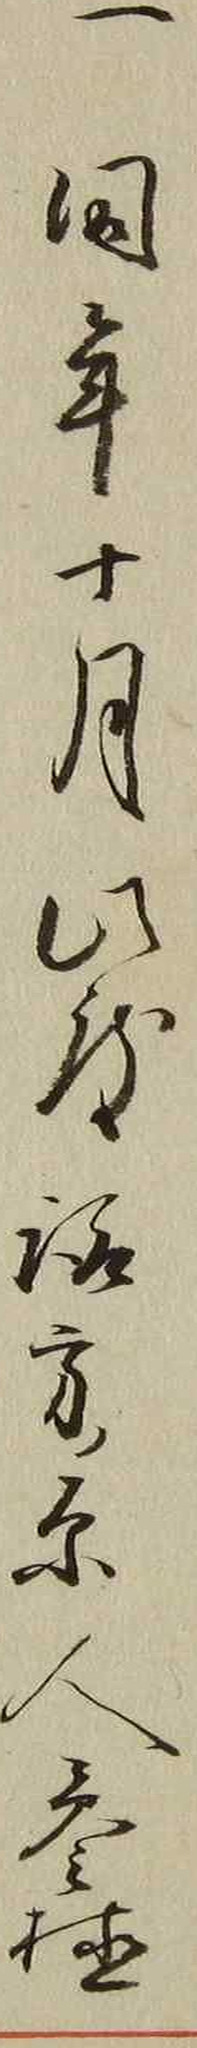一同年十月此度諏方ノ原人参植
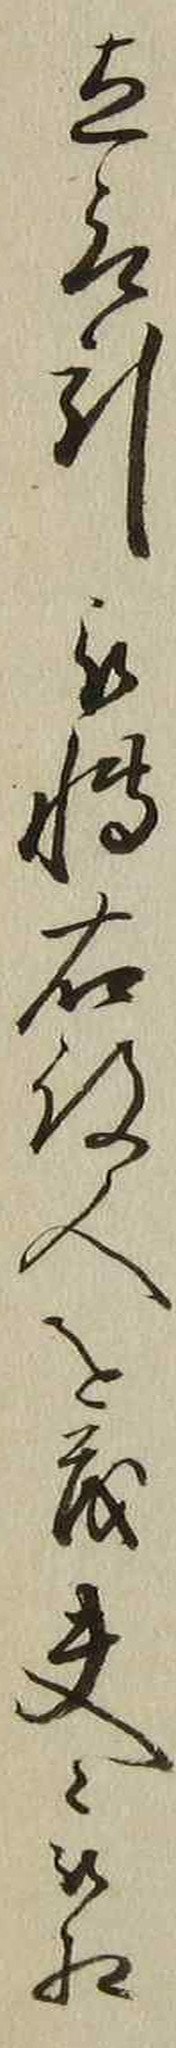立取計被転右役人をも夫々被相
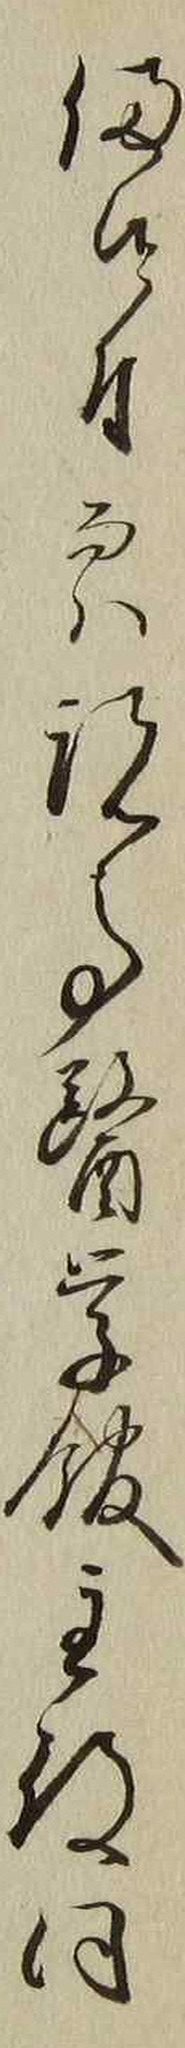備候ニ付而ハ諸事医学館主役同
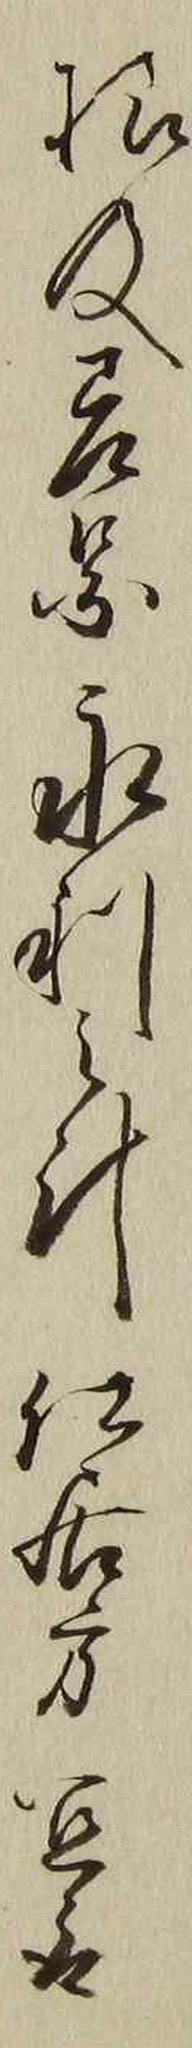様及差図永利之計仕居方宜取
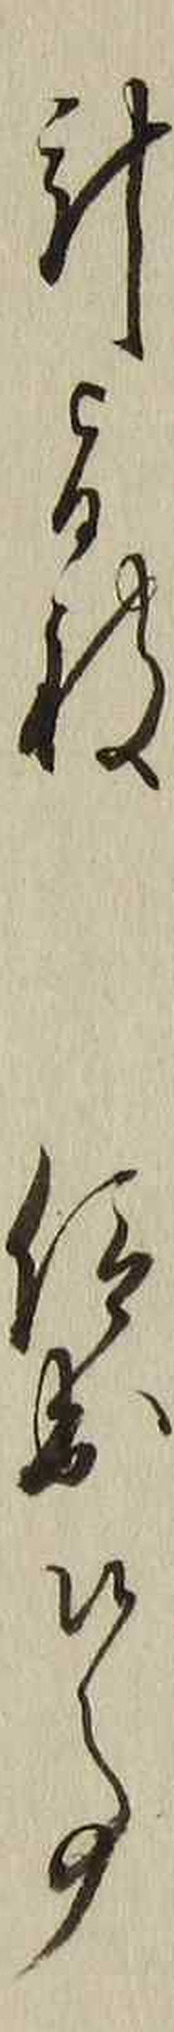計旨被仰出候事
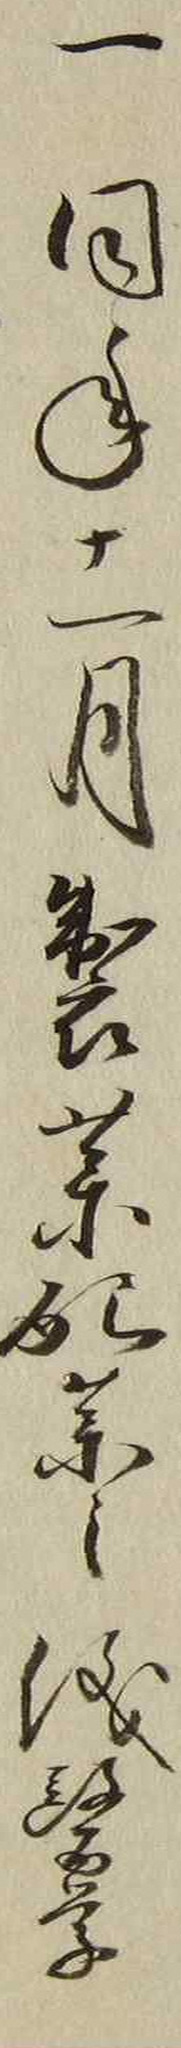一同年十一月製薬配薬之儀医学
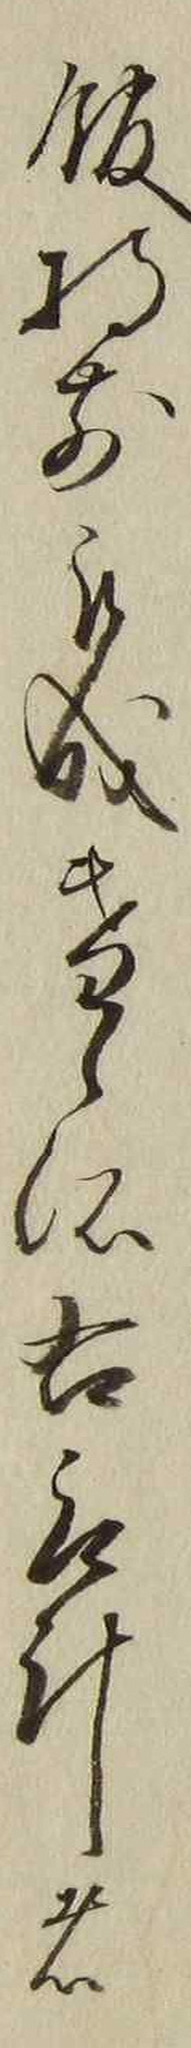館持前被成替候所右取計者
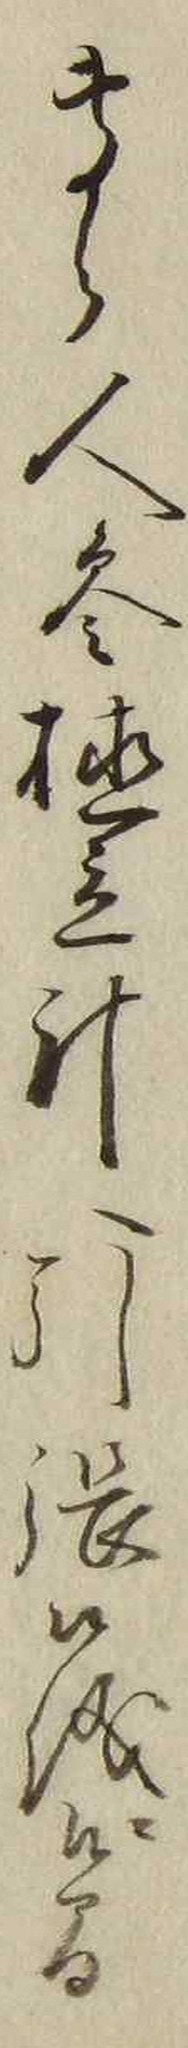専ら人参植立計へ引張候儀ニ候間
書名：諸士系譜　巻之2　い之部2
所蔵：会津若松市立会津図書館
